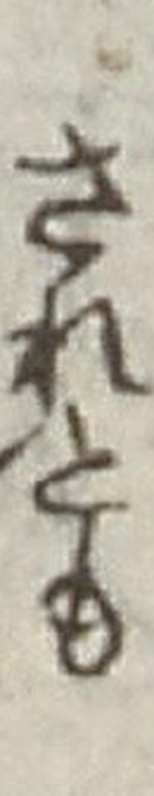されども
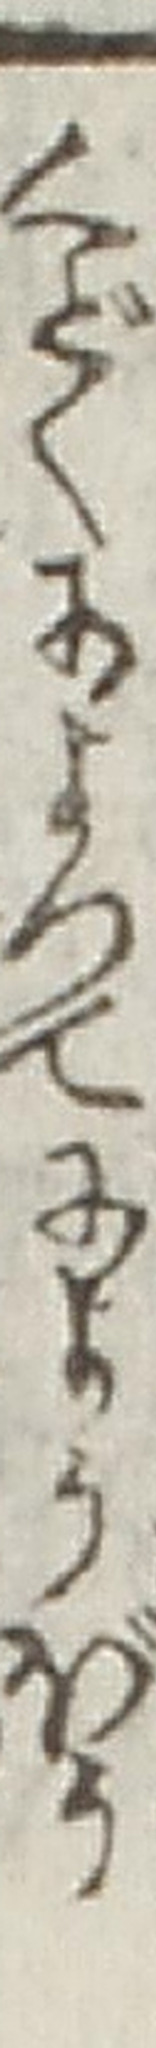くどくによつてにようばう
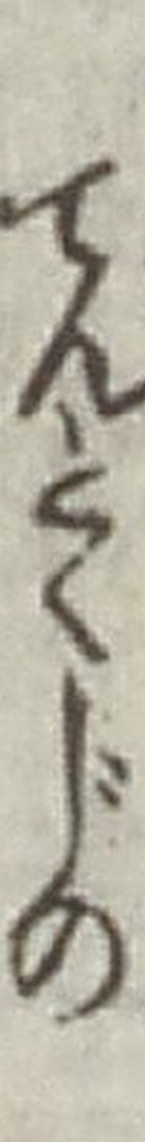てんとくじの
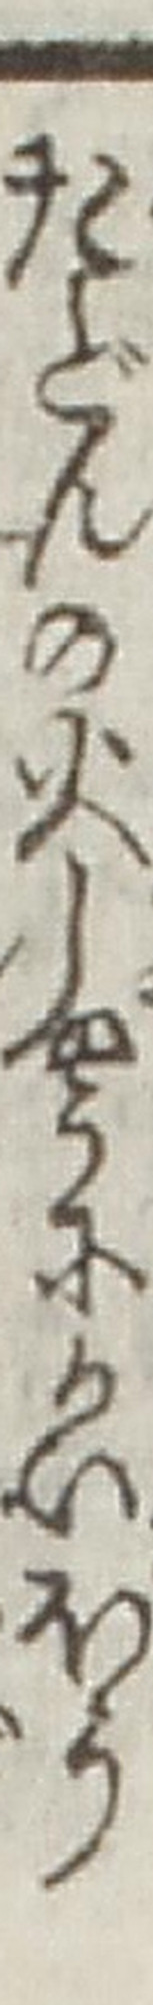たどんの火しやうにかいほう
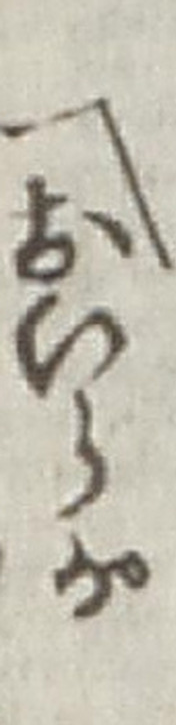〽おいらが
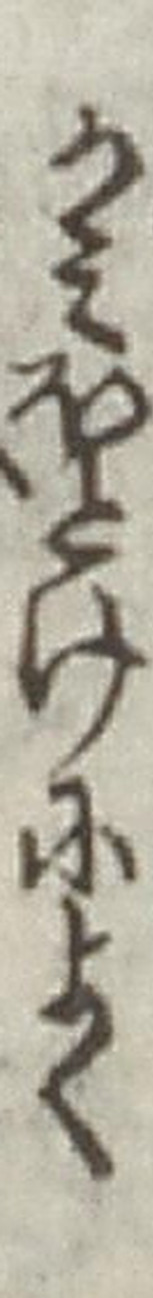かみほとけによく
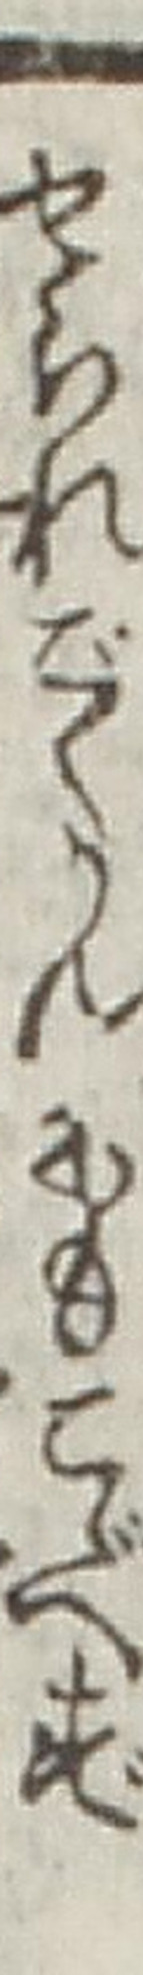せられごくかんにもこゞへず
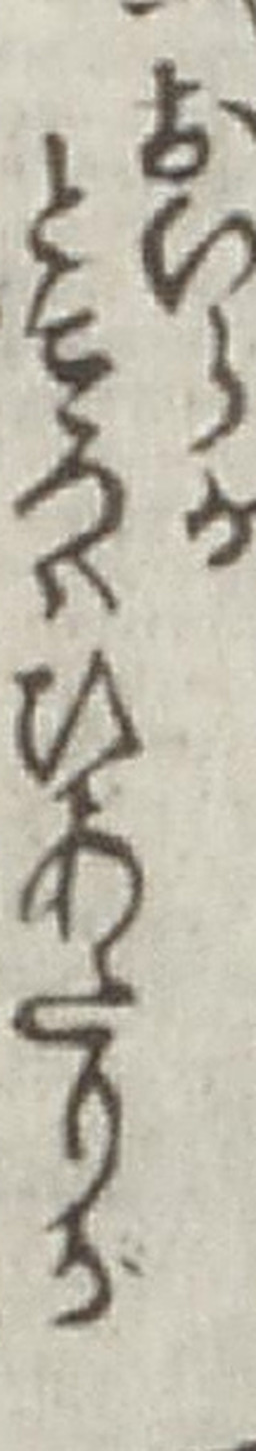ところはひあたりが
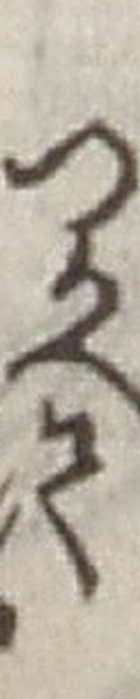つかへて
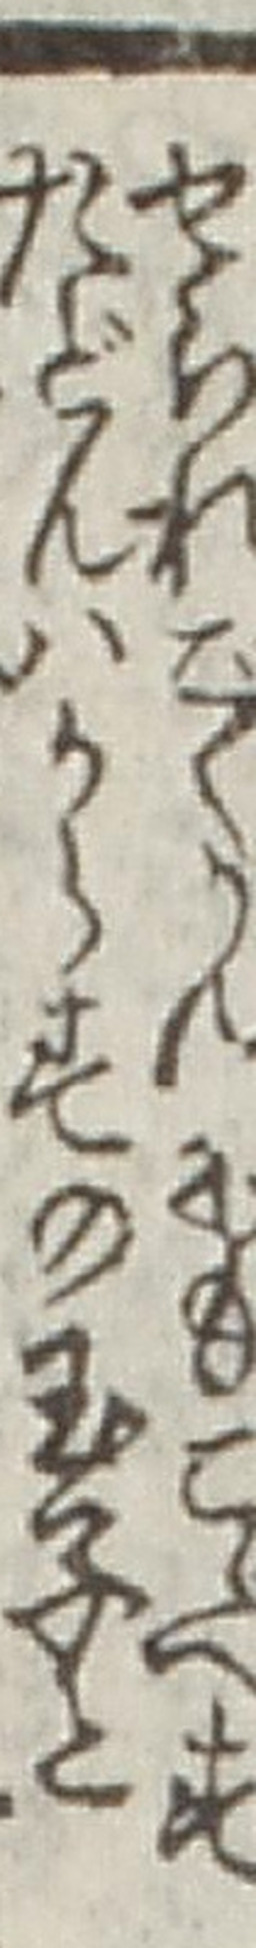たどんはからすの玉子と
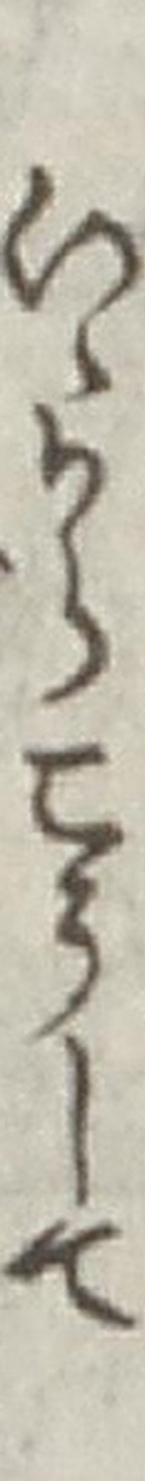いゝからこうして
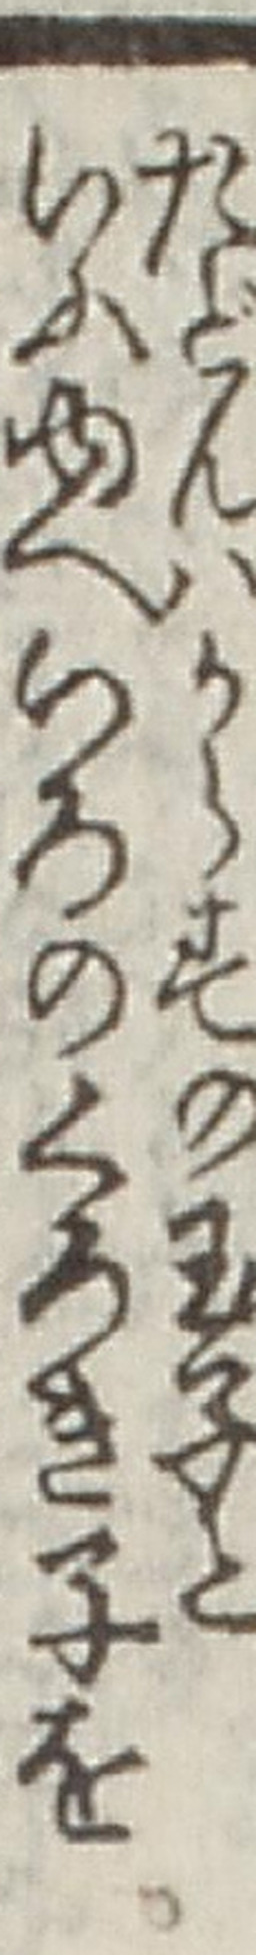いふゆへいろのくろき子を
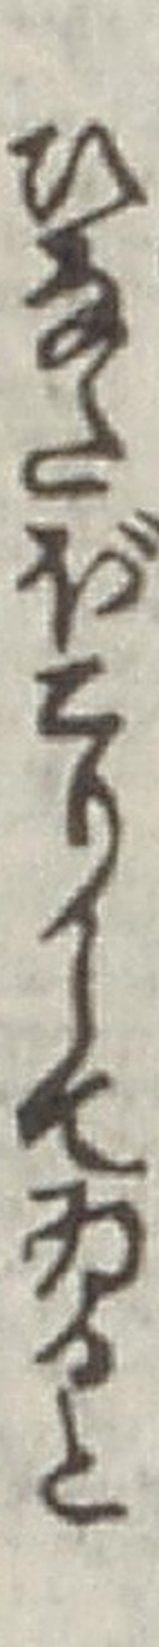ひなたぼこりしｒてゐると
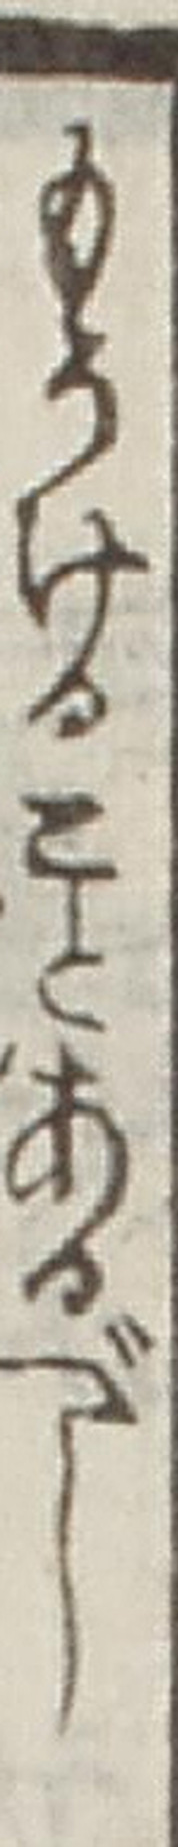もうけることあるべし
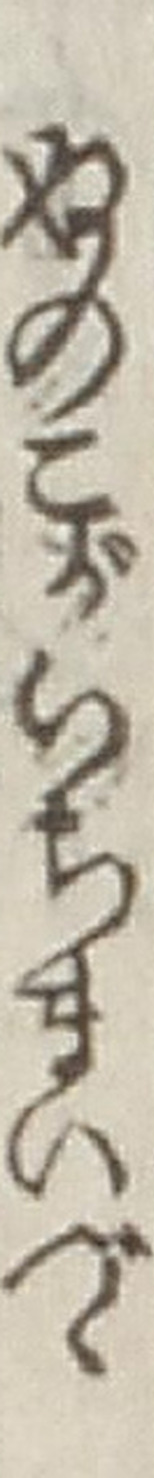ぬのこがいちまいづゝ
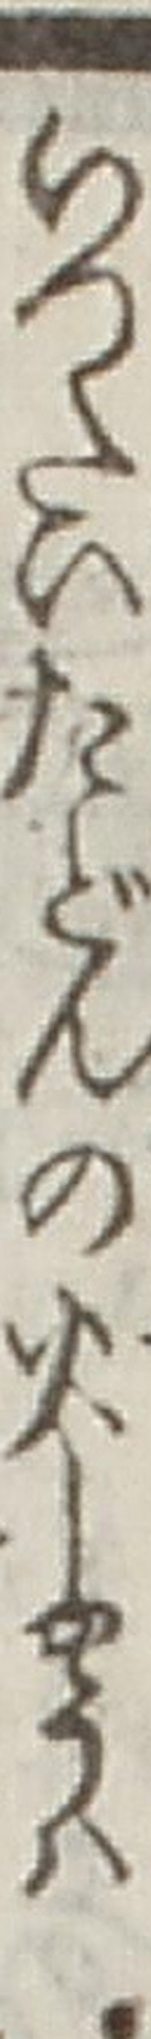いつたいたどんの火しやうは
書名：三世相出雲當座帳　上下冊
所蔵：東京大学地震研究所図書室 Earthquake Research Institute Library, The University of Tokyo, JAPAN
